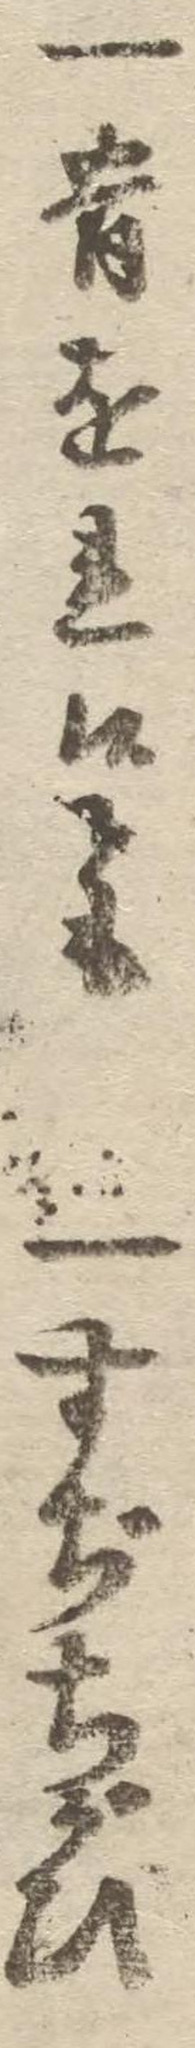一骨をれ候ても一すじちがひ
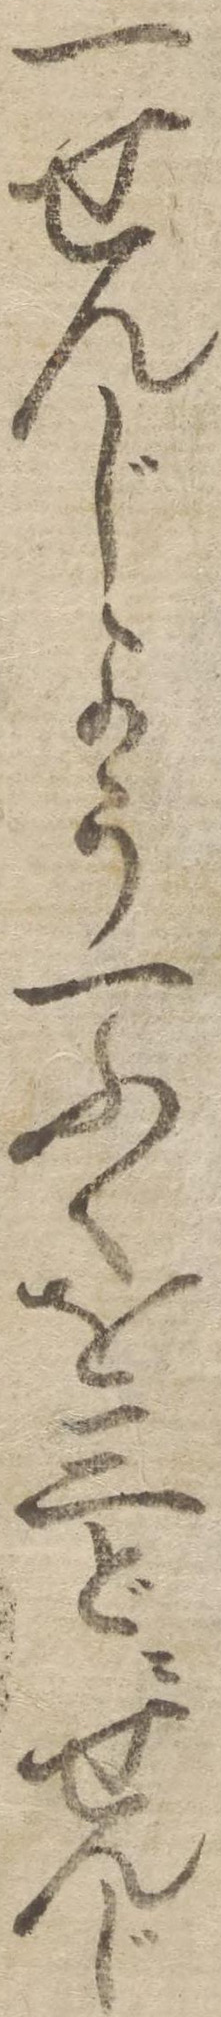一せんじよう一ふくを三どにせんじ
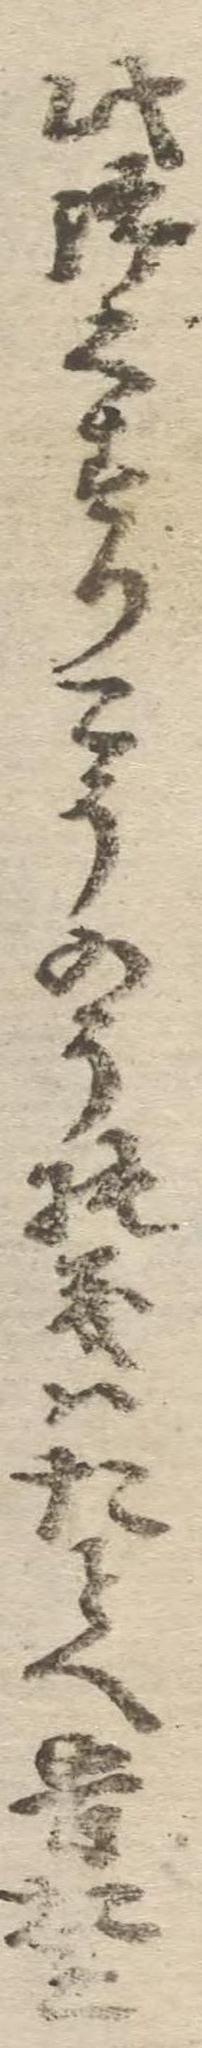此御くすりこうのうの義はたとへ骨おれ
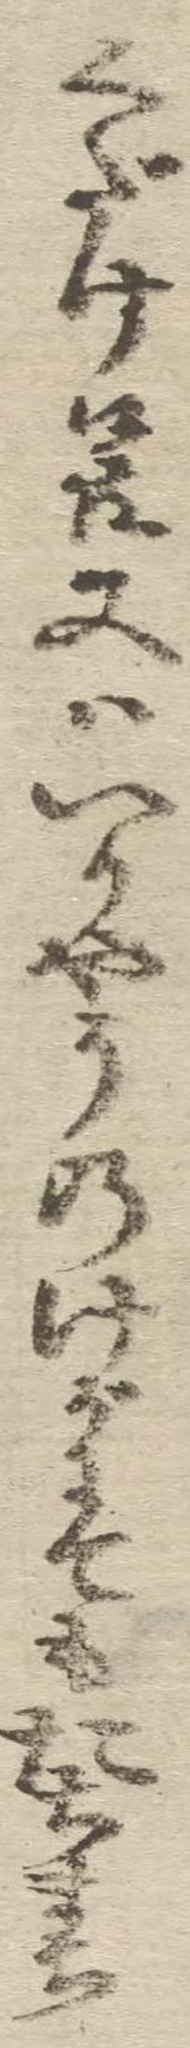くだけ候共又はいかやうのけがにてもたちまち
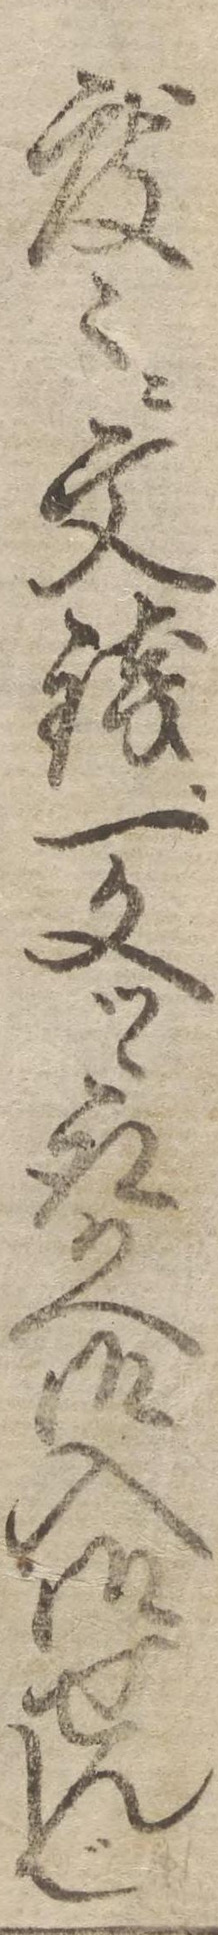度々に文銭一文つゝ取かへ御入御せんじ
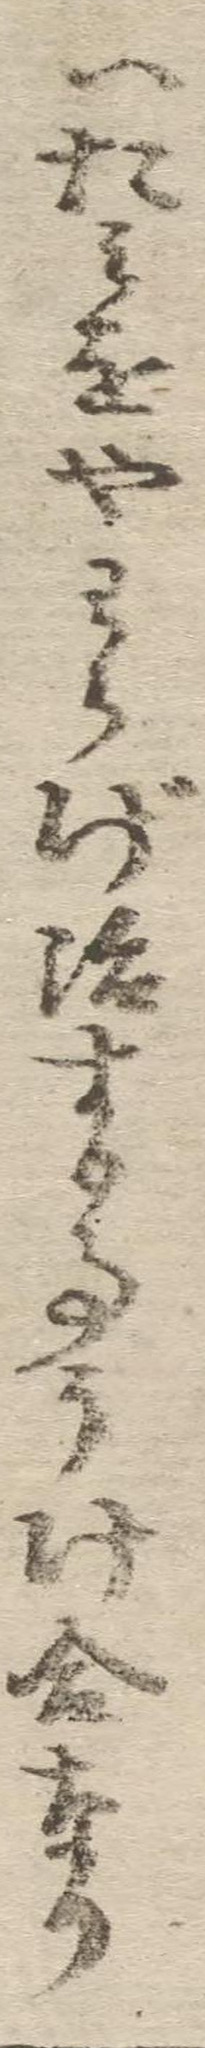いたみをやわらげ治する事うけ合なり
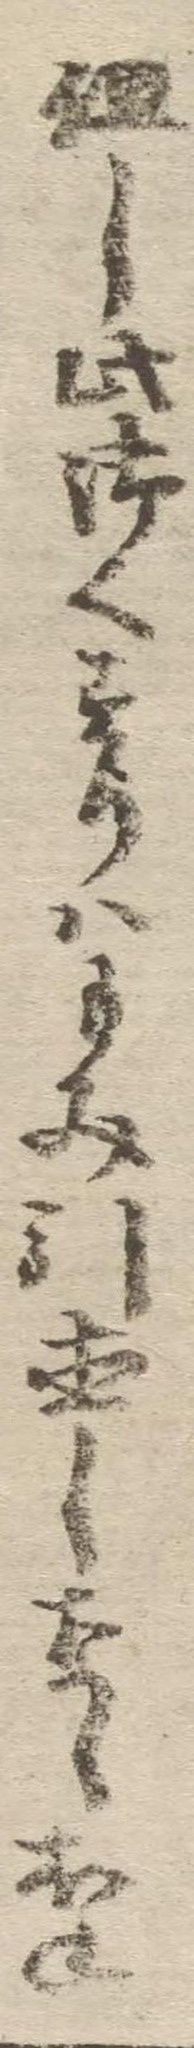但し此御くすりはもみ引直しなしほね
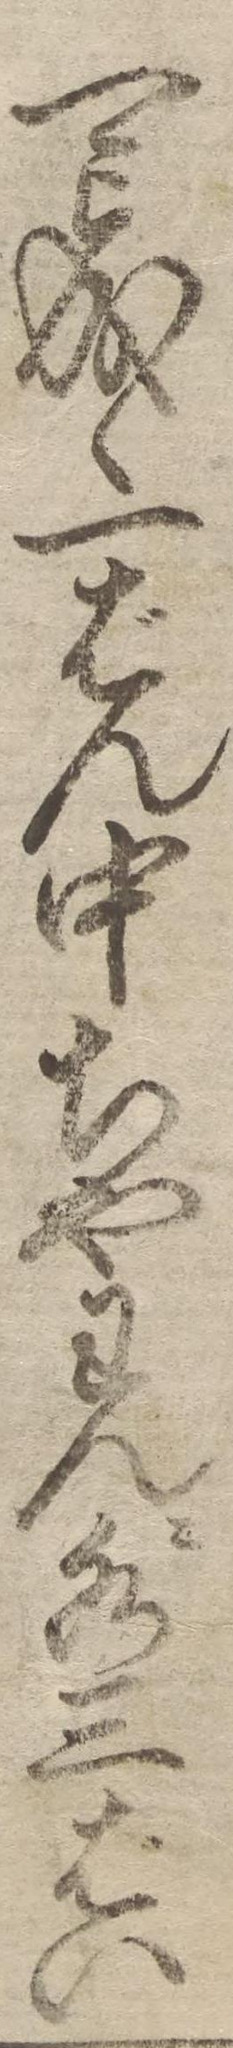可被成候一ばん中ちやわんに水三ばい
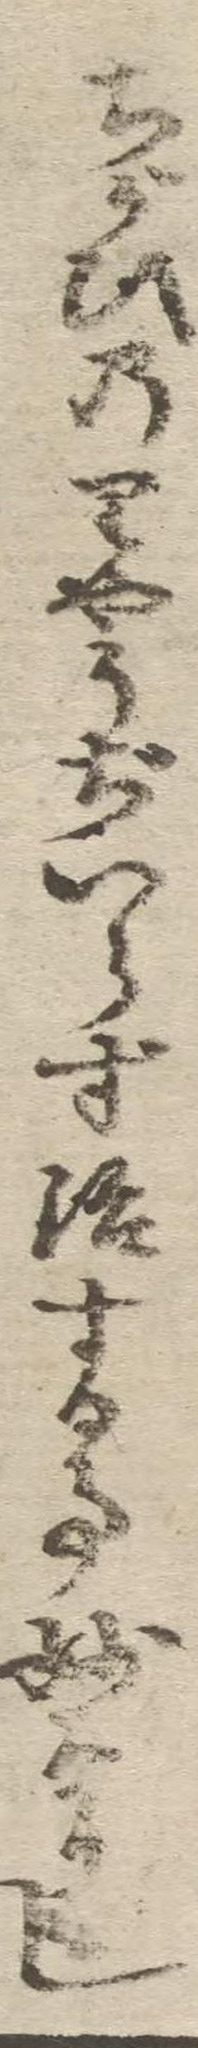ちがひのりやうぢいらず治する事妙なる也
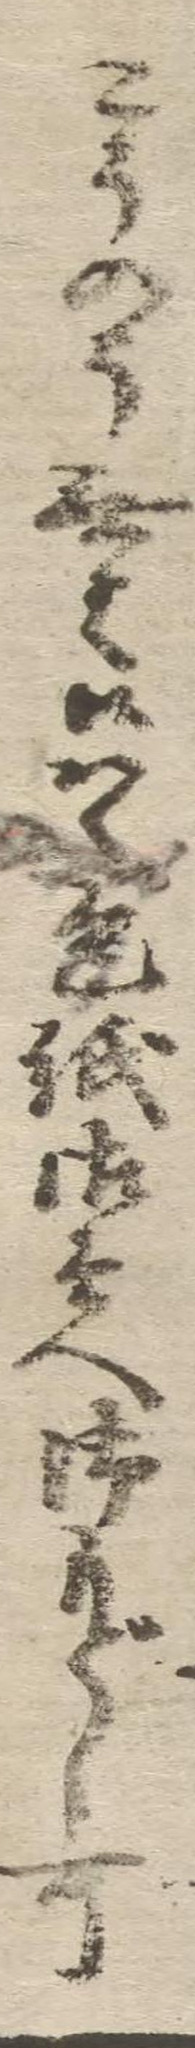こうのう無之候はゝ包紙御そへ御もどし可
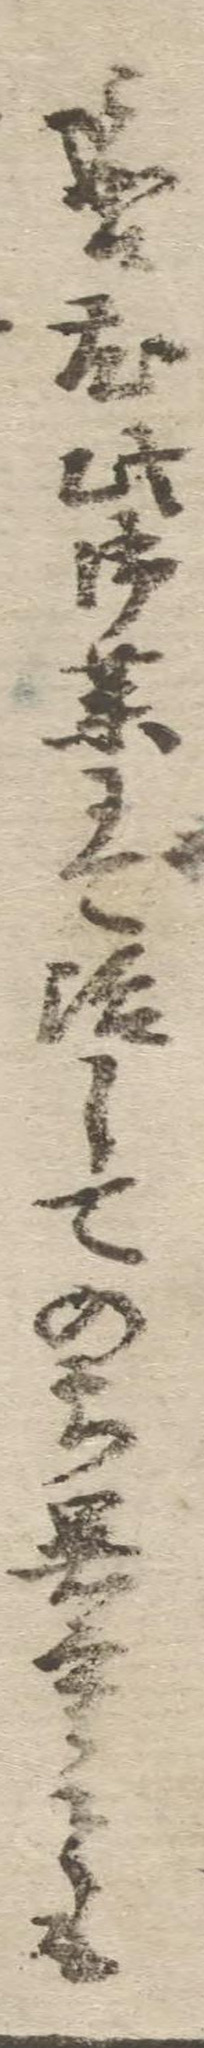被成候尤此御薬にて治してのち暑ても
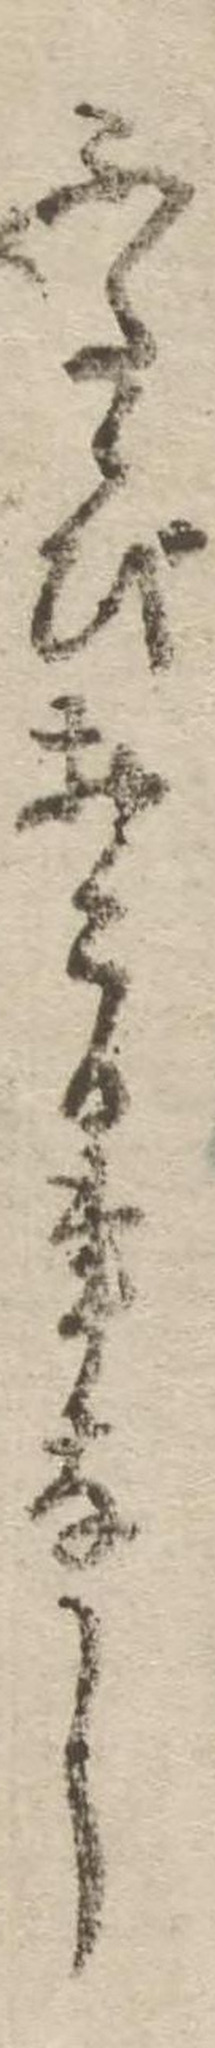ふたたびおこる事はなし
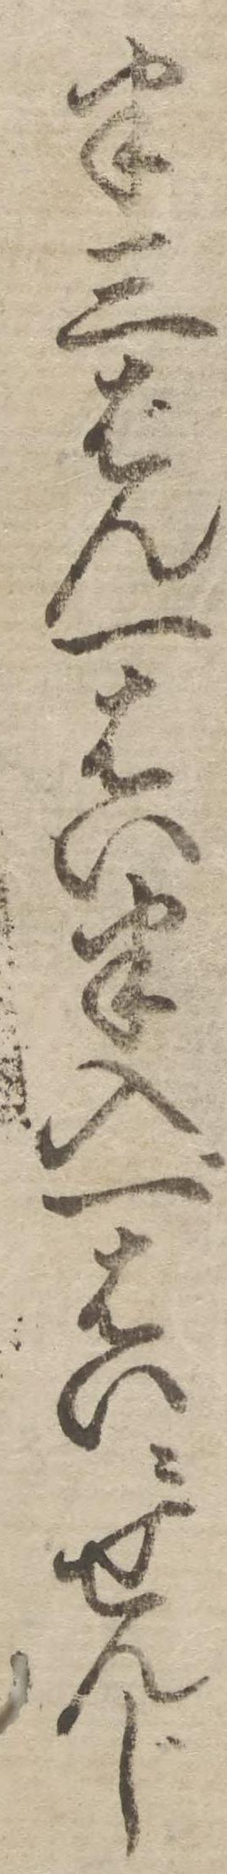半三ばん一はい半入一はいにせんじ
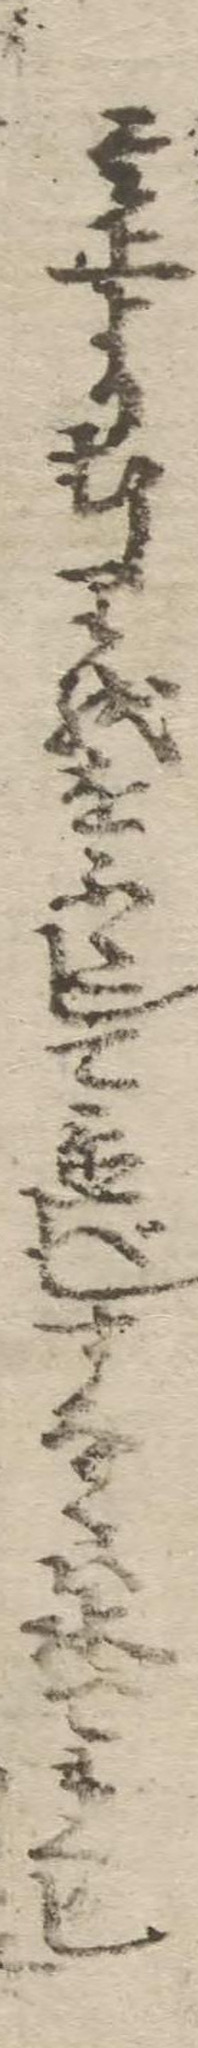其上よりむし紙をふたして置べしすなくは水でもくくるしからす
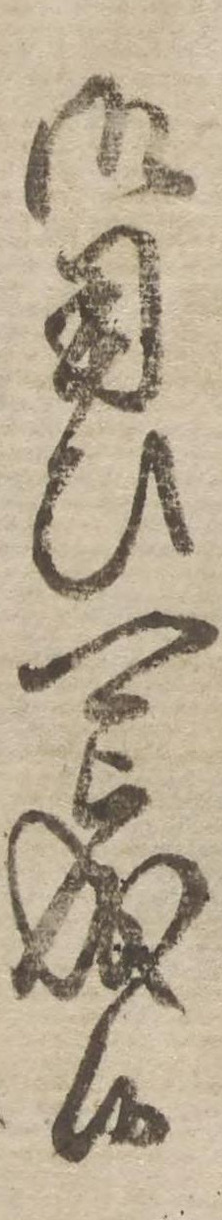御用ひ可被成候
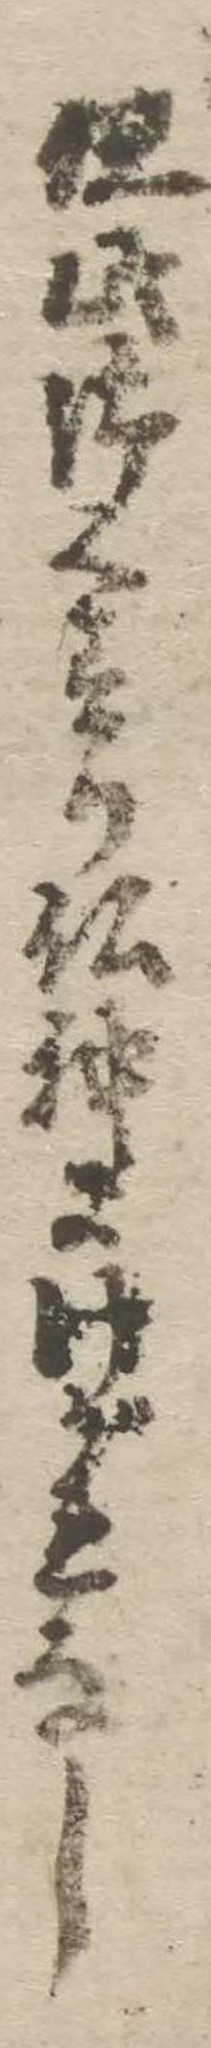但此御くすり仏神にけがれなし
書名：浪華薬種問屋能書張交帖. 二
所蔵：国立国会図書館 National Diet Library, JAPAN
